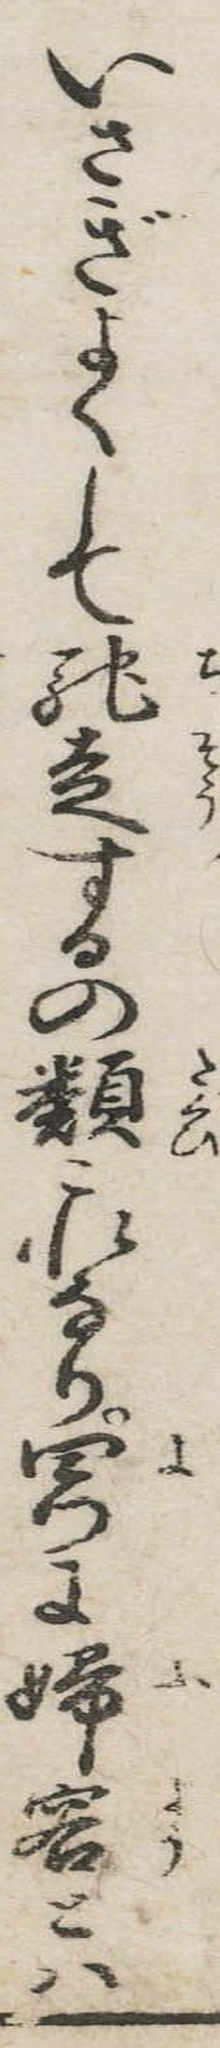いさぎよくして馳走するの類これなり。四つに婦容とは
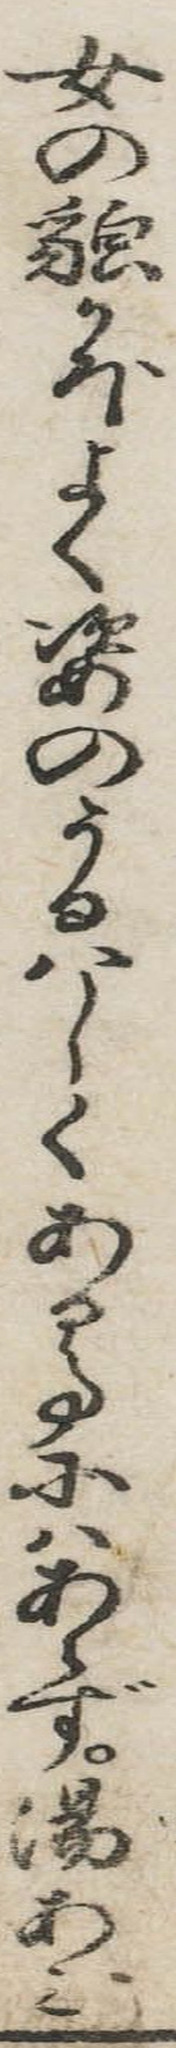女の貌かほよく姿のうるはしくある事にはあらず。湯あひ
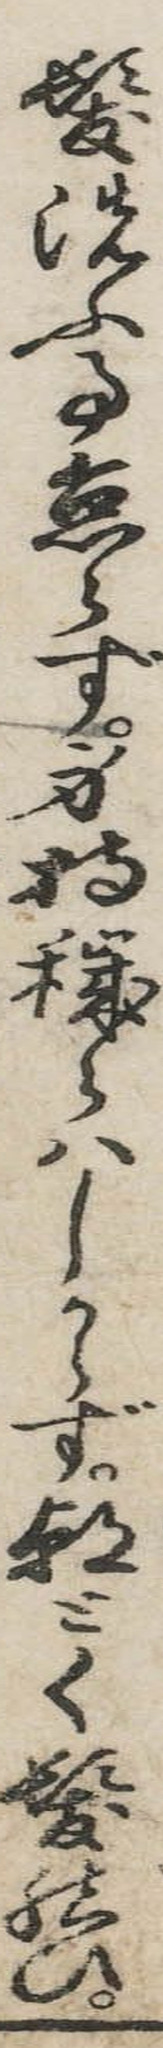髪洗ふ事怠らず。身持穢らはしからず。朝とく髪結ひ。
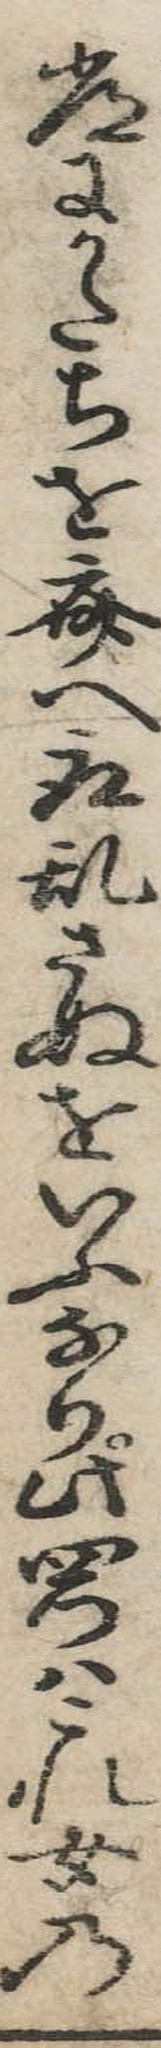常にかたちを齊へ取乱さぬをいふなり。此四つはこれ女乃

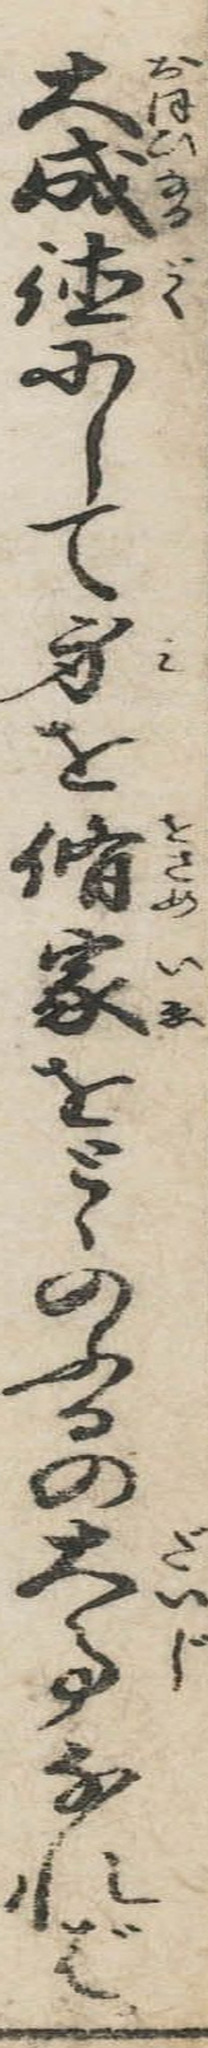大成徳にして身を修家をとゝのふるの大事なれば
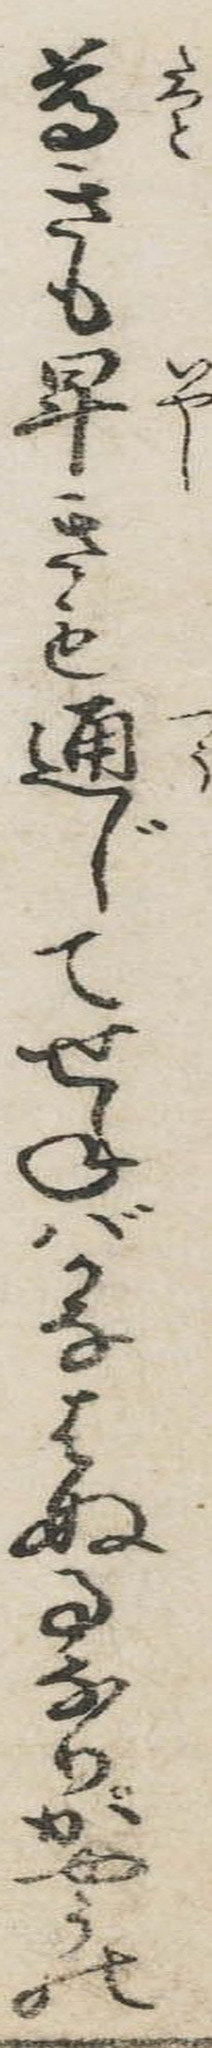尊きも卑きも通じてせねばかなはぬ事なり。かやうの
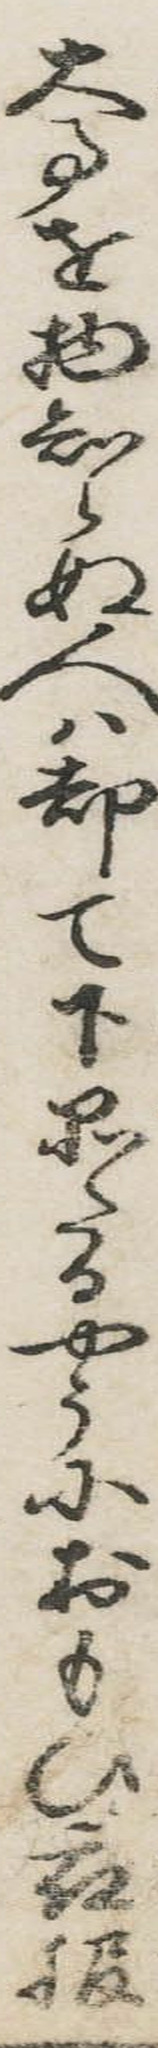大事を物知らぬ人は却て下品たるやうにおもひ衣服
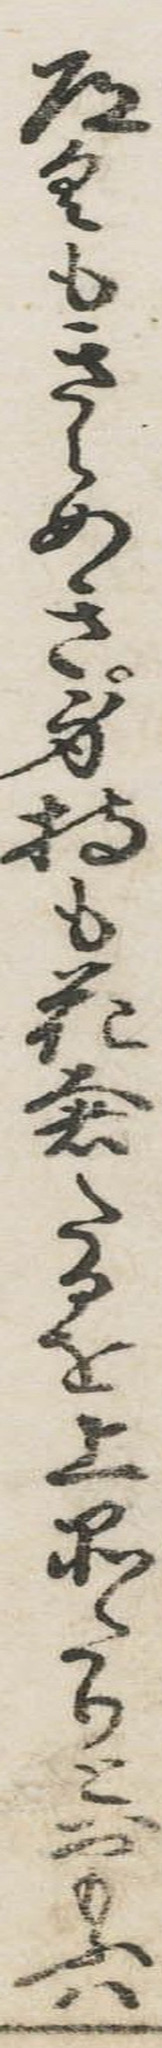道具もきらめき。身持も花奢たるを上品たりとおもふは
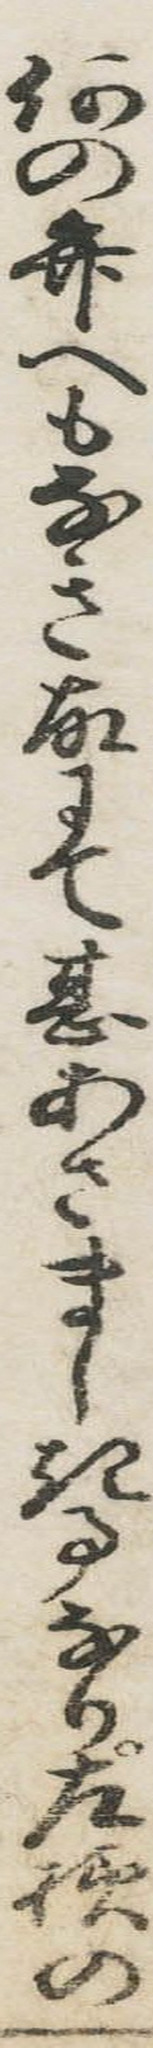何の弁へもなき故にて甚あさましき事なり。左様の
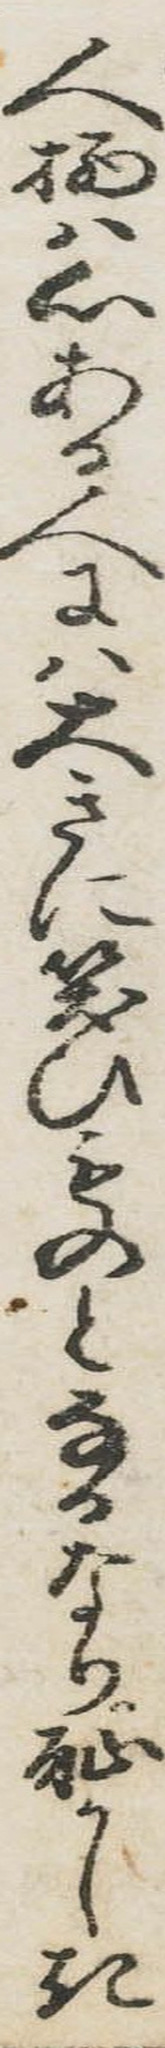人柄は心ある人には大きに笑ひものとなるなり。恥かしき
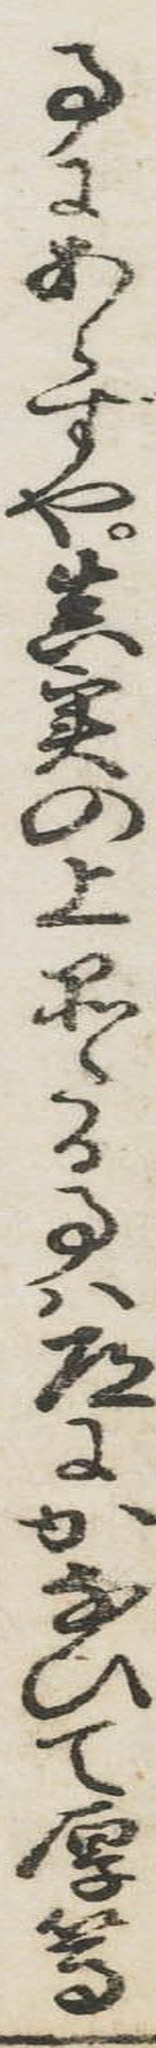事にあらずや。真実の上品たる事は道にかなひて厚等
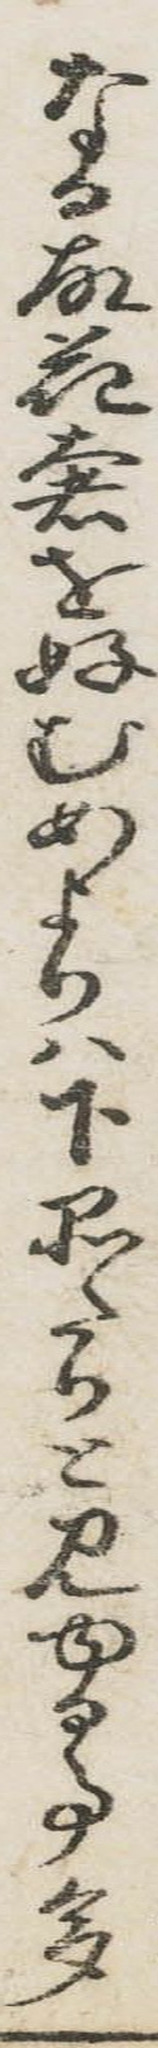なる故花奢を好むめよりは下品たりと見ゆる事多
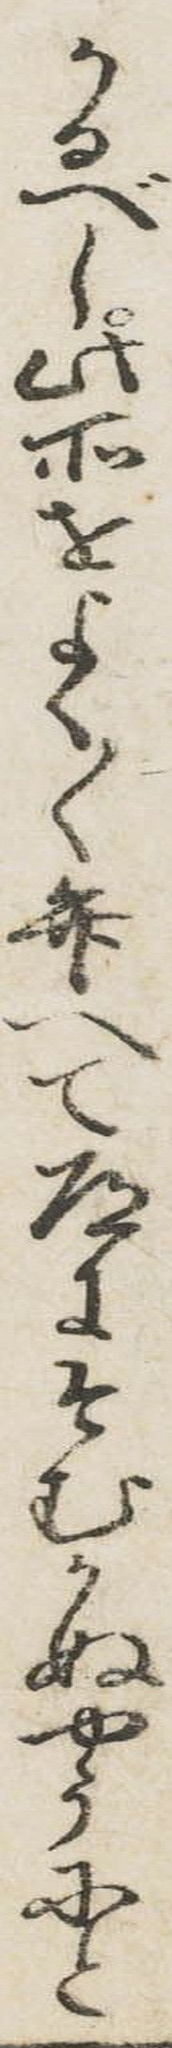かるべし。此所をよく〳〵弁へて道にそむかぬやうにと
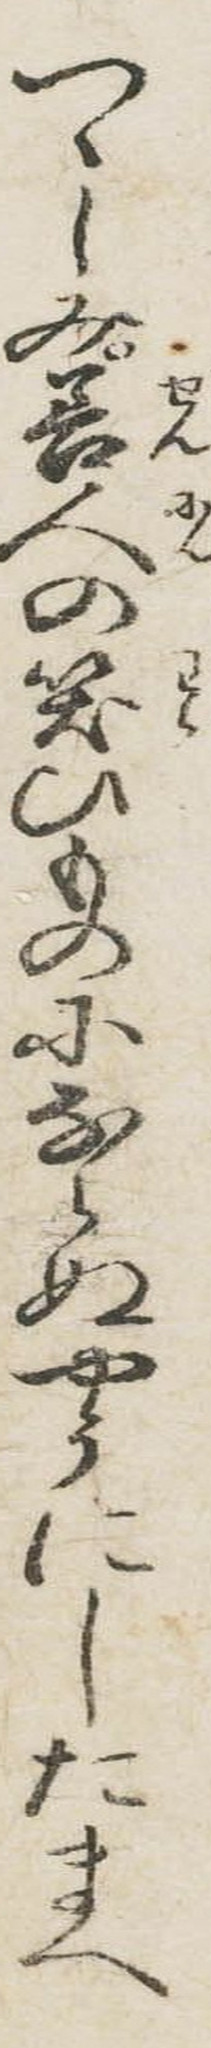つゝしみ。善人の笑ひものにならぬやうにしたまへ
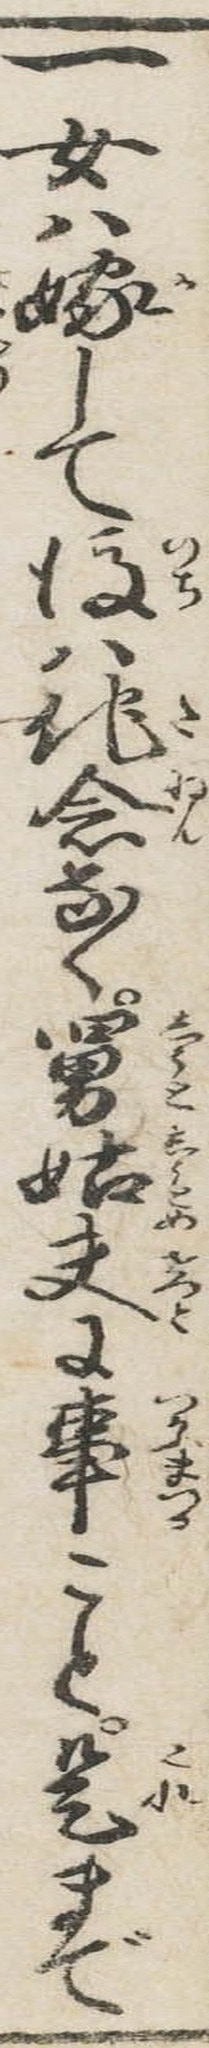一女は嫁して後は他念なく。舅姑夫に事こと。是まで
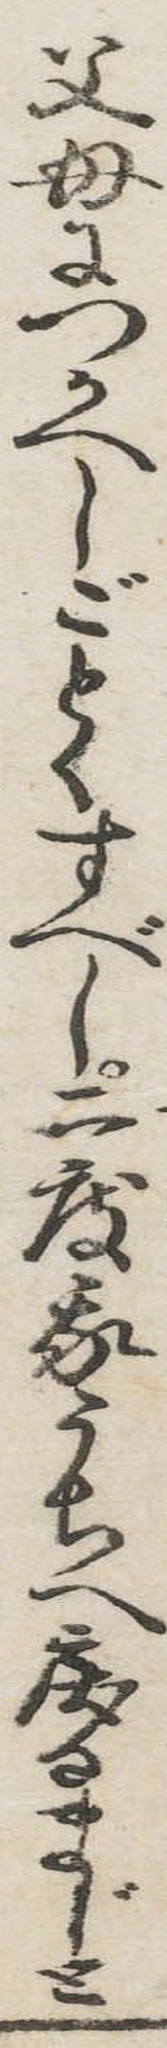父母につかへしごとくすべし。二度我うちへ戻るまじと
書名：前訓
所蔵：東京学芸大学附属図書館
